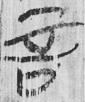言
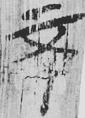不
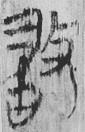敢
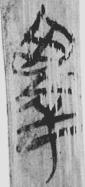睪
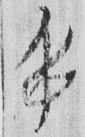身
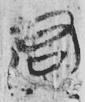君
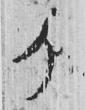人
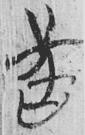者
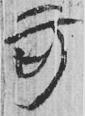可（何）
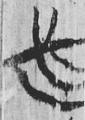必
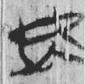𡚦
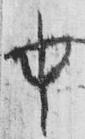才（哉）
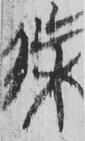傑（桀）
